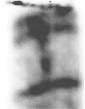王
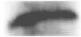一
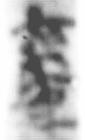𨍱（乘）
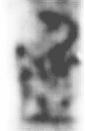○（路）
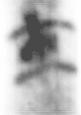車
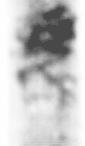麗
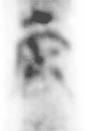兩
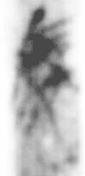駟
